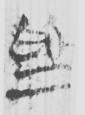爲
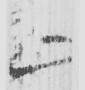上
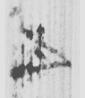之
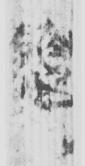道
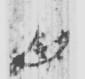㠯（以）
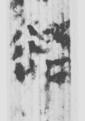欲
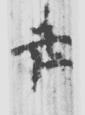下
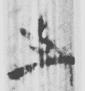之
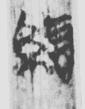紿
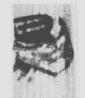則
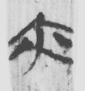亦
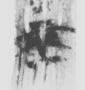不
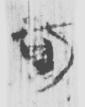可
